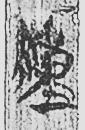陳
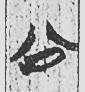公
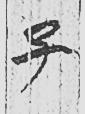子
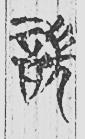{言山一王}
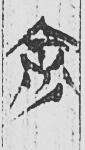余
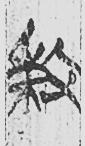殺
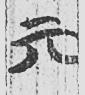亓
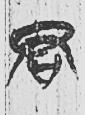君
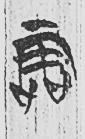霝
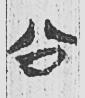公
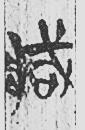戕
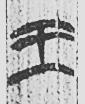王
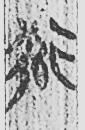率
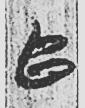𠂤
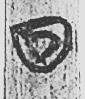回
